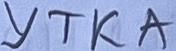утка
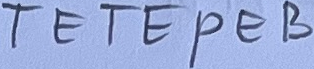тетерев
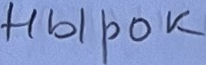нырок
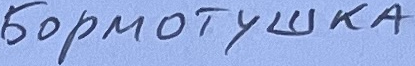бормотушка
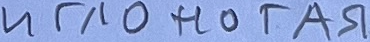иглоногая
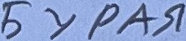бурая
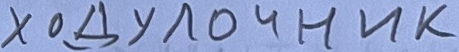ходулочник
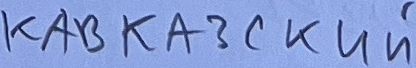кавказский
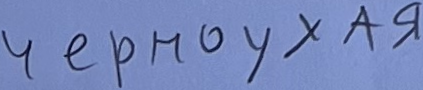черноухая
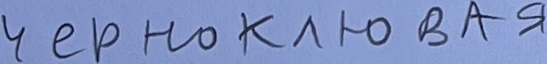черноклювая
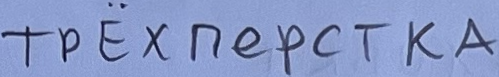трёхперстка
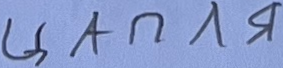цапля
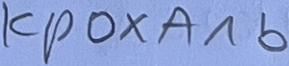крохаль
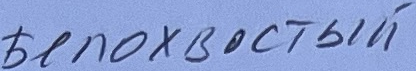белохвостый
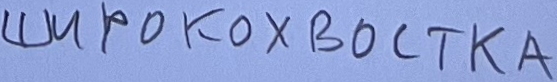широкохвостка
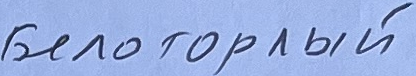белогорлый
